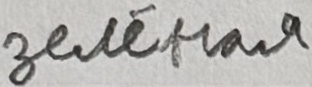зелёная
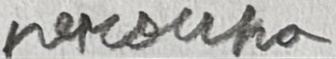пеночка
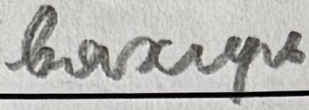вяхирь
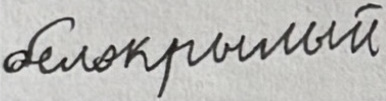белокрылый
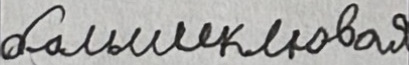большеклювая
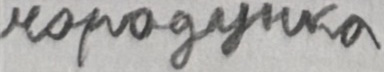мородунка
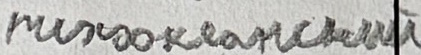тихоокеанский
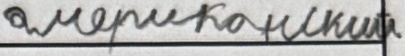американский
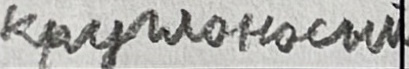круглоносый
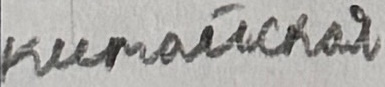китайская
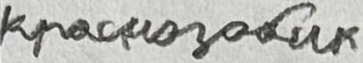краснозобик
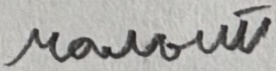малый
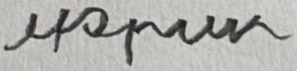люрик
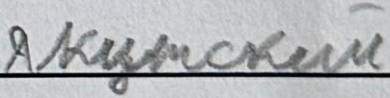якутский
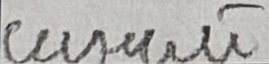синий
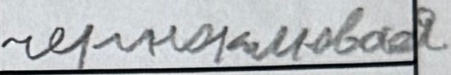черноклювая
